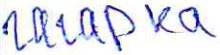гагарка
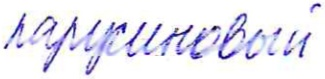парусиновый
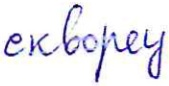скворец
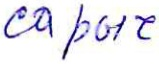сарыч
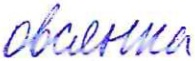овсянка
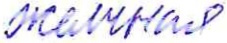желчная
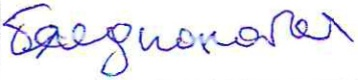бледноногая
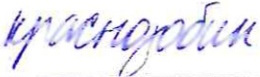краснозобик
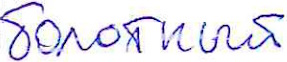болотный
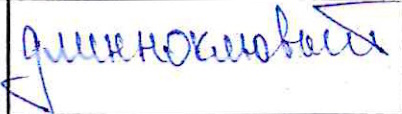длинноклювый
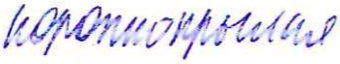короткокрылая
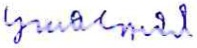ушастяя
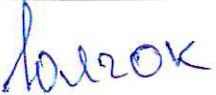волчок
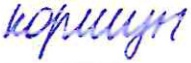коршун
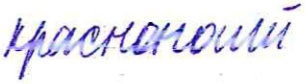красноногий
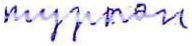турпан
